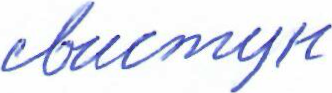свистун
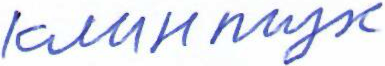клинтух
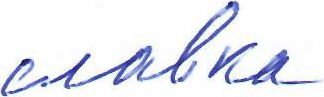славка
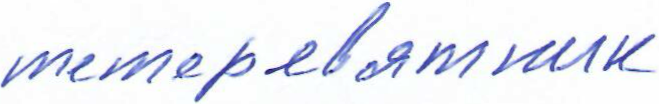тетеревятник
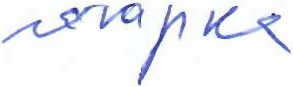гагарка
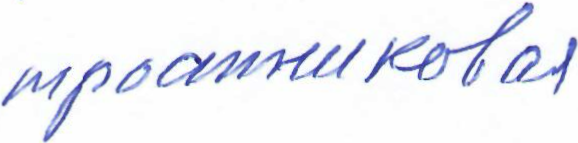тростниковая
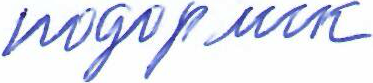подорлик
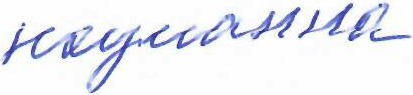науманна
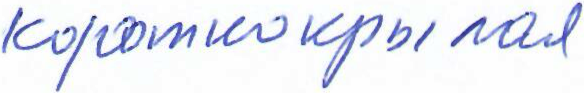короткокрылая
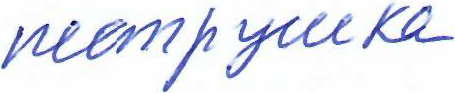пеструшка
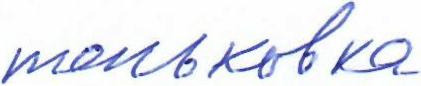теньковка
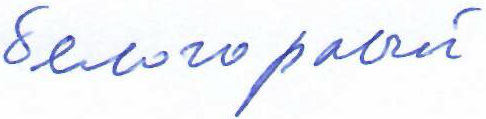белого рлый
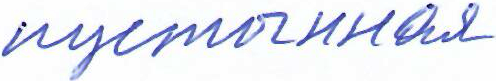пустынная
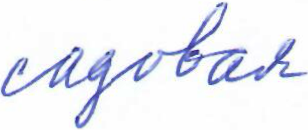садовая
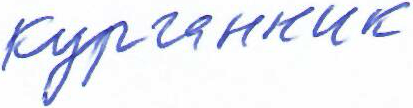курганник
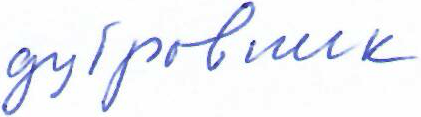дубровник
